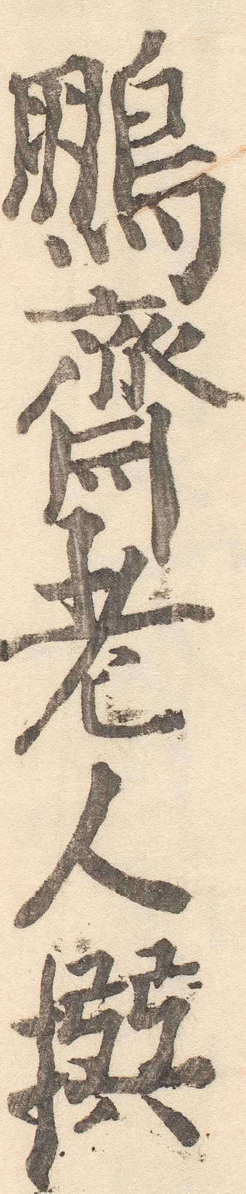鵬斎老人撰
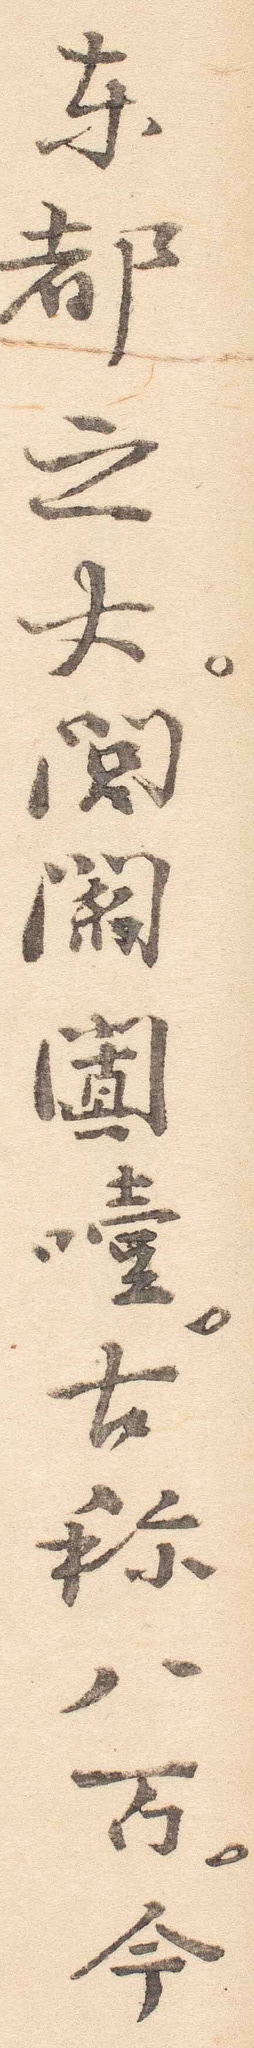東都之大。閲閻闐噎。古称八百。今
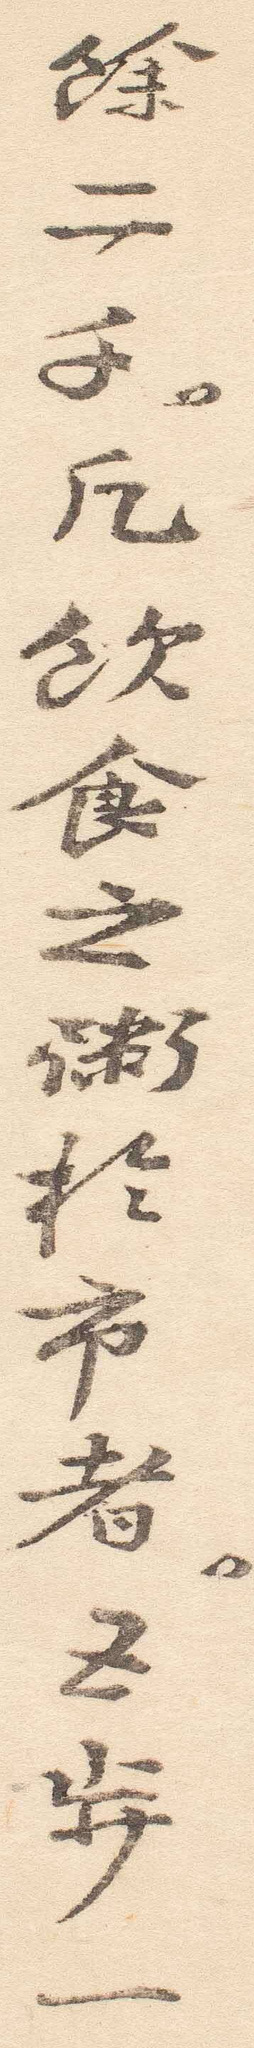余二千。凡飲食之粥於市者。五歩一
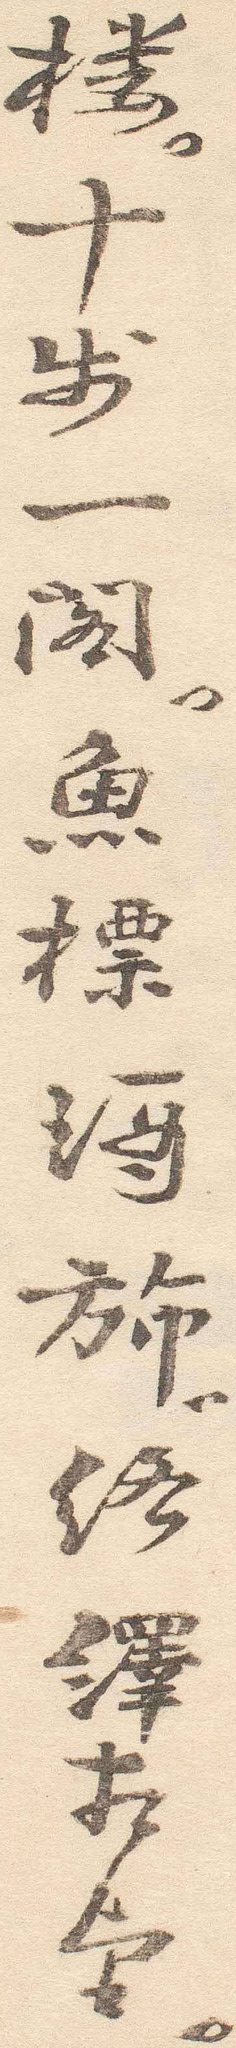楼。十歩一閣。魚標河旆。絡繹相望。
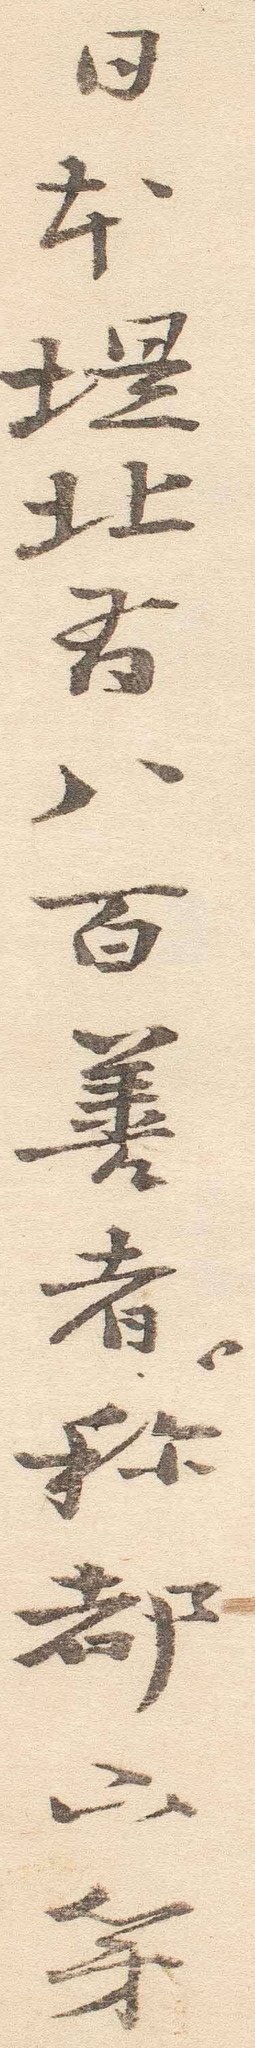日本堤北有八百善者。称都下第
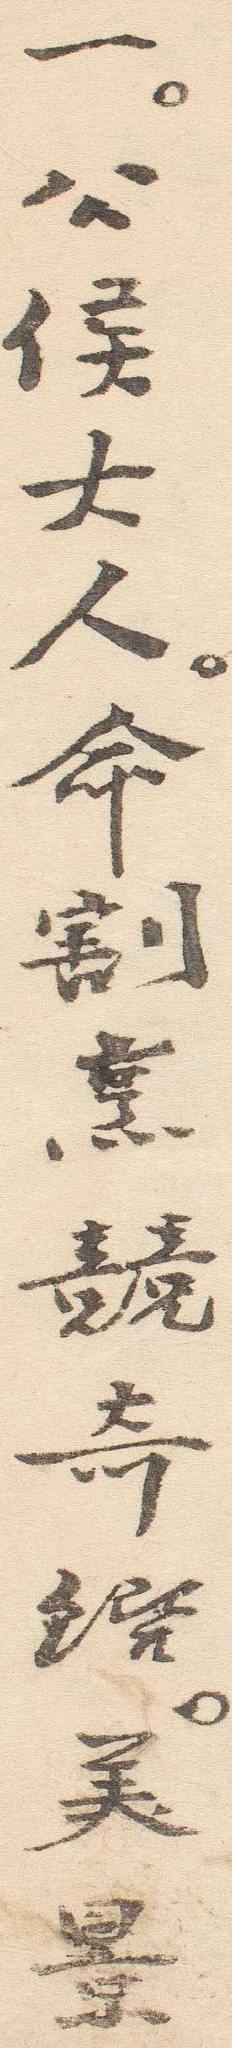一。公侯大人。命割烹競奇饌。美景
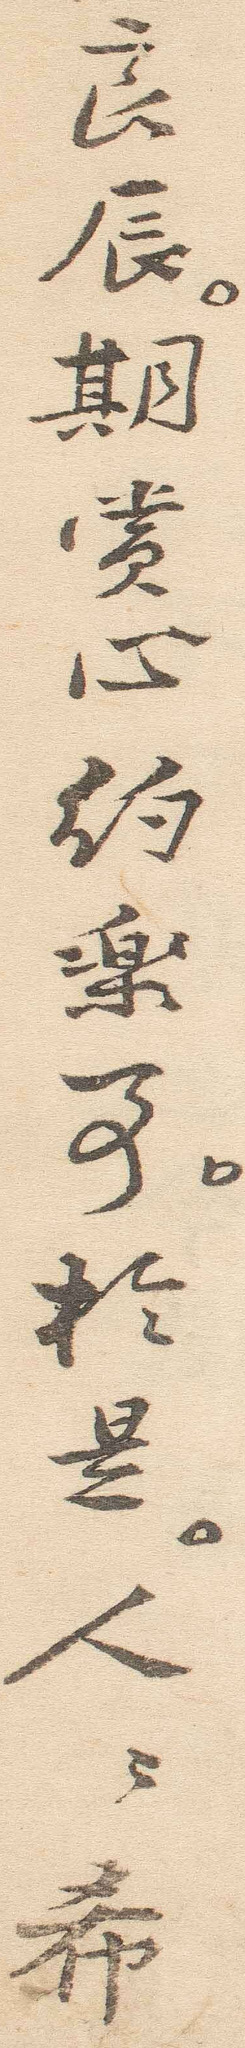良辰。期賞心約楽事。於是。人々希

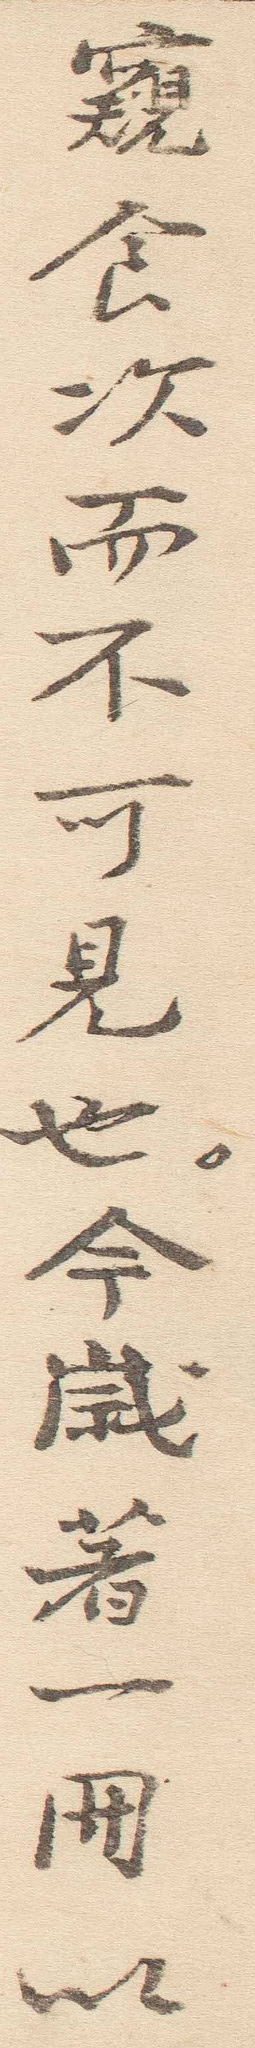窺食次而不可見也。今歳著一冊以
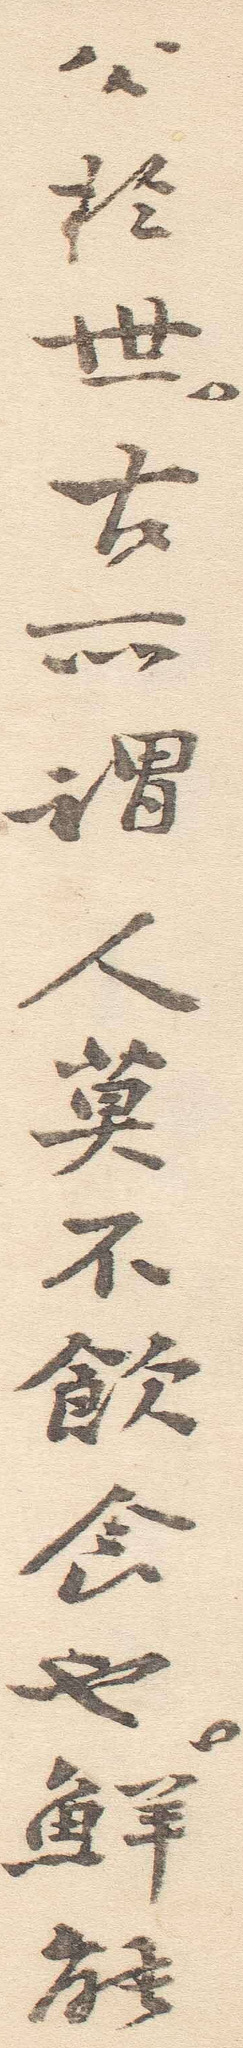公於世。古亦謂人莫不飲食也。鮮能
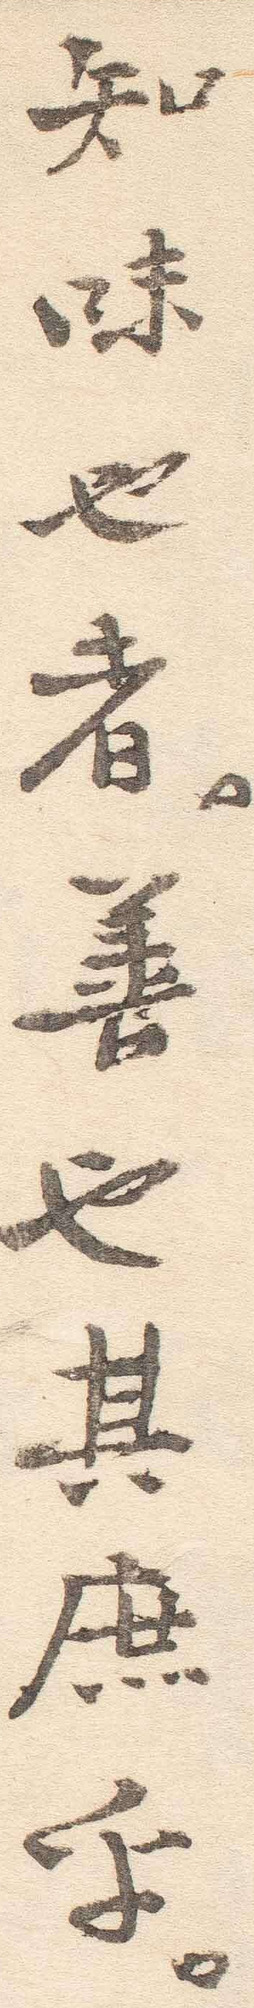知味也者。善也其庶乎。
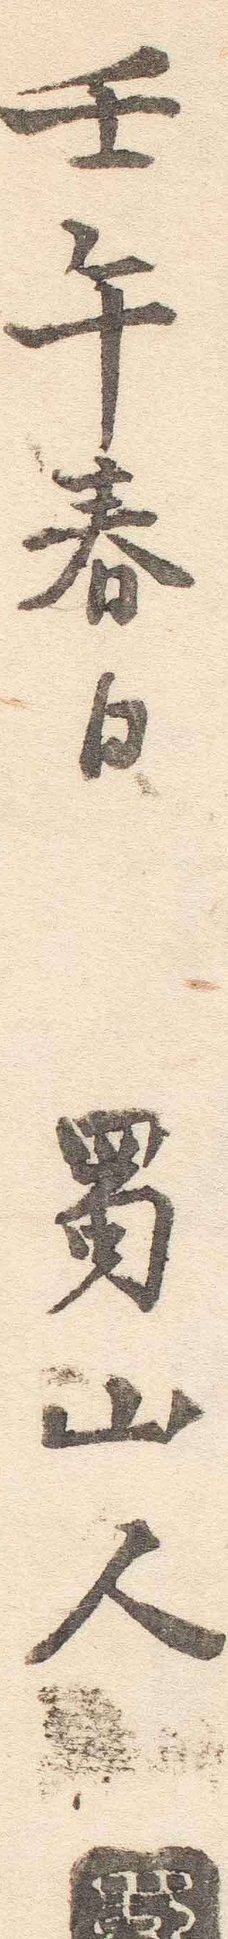壬午春日蜀山人
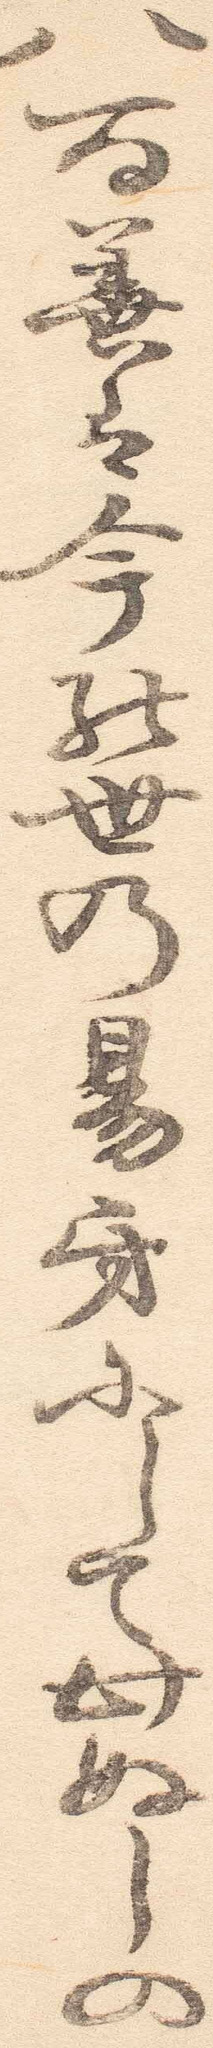八百善は今の世の易牙にして此ぬしの
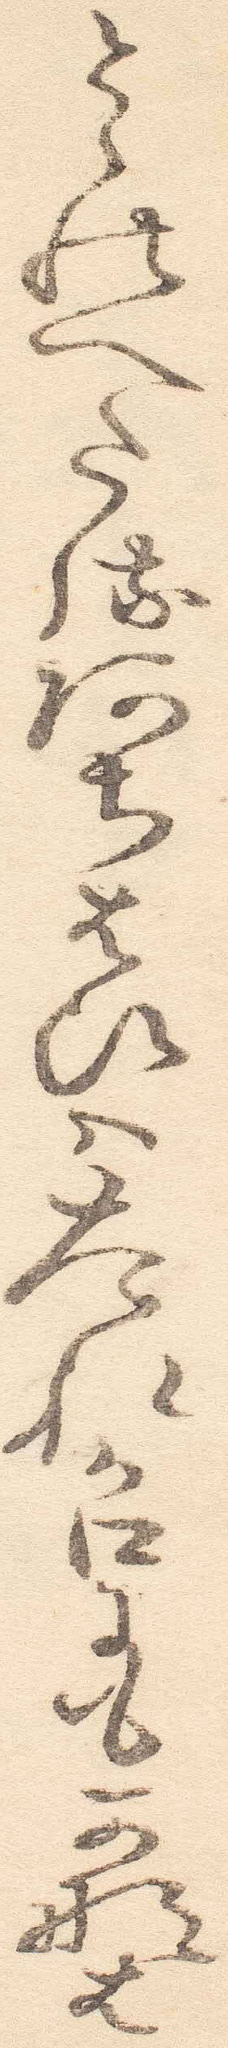とゝのへたるあちはひはたれか口にもかなは
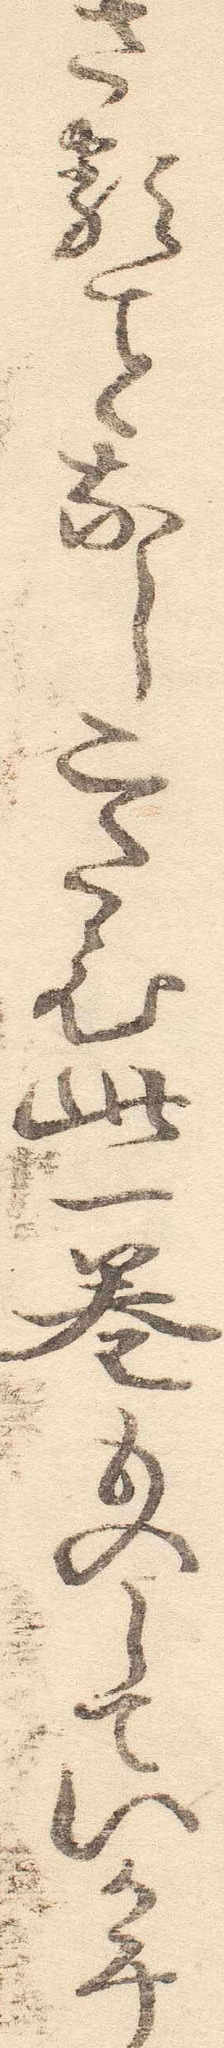さることなしこたひ此一巻ものしていかに
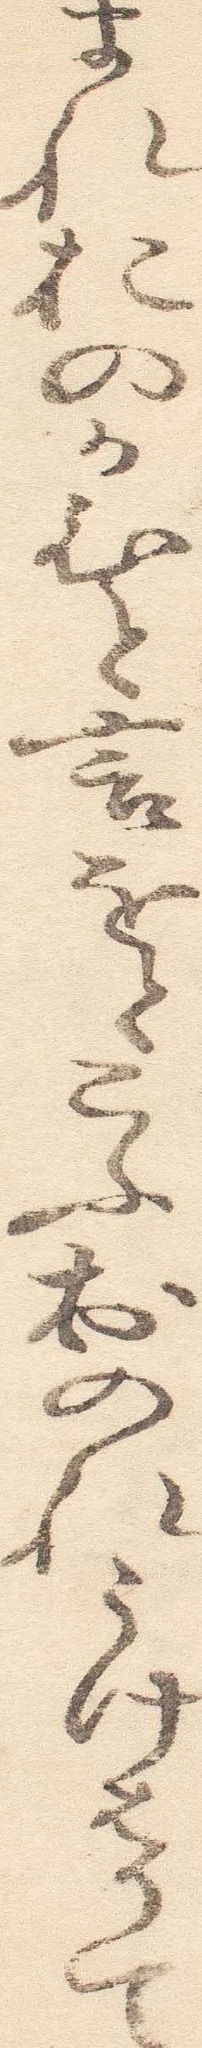まれおのかひと言をとこふおのれうけはりて
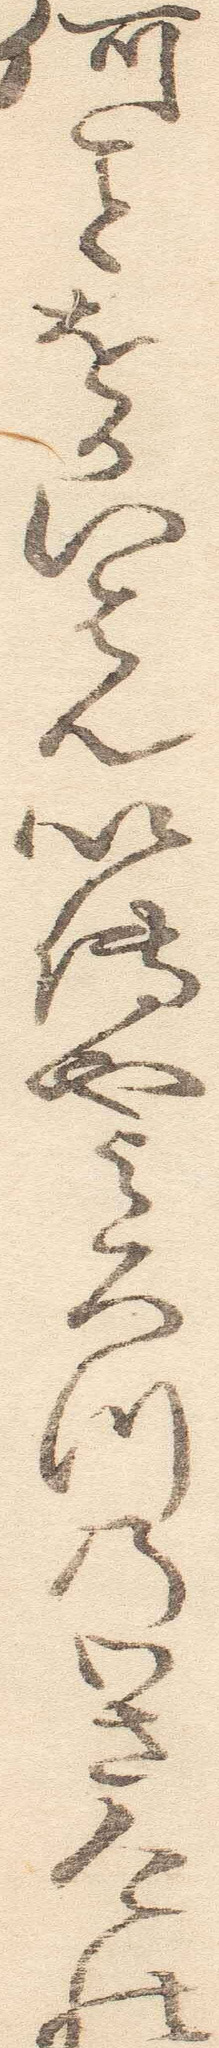何ことをかいはんいてやよろつのわさけの
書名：料理通
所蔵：東京学芸大学附属図書館 国文学研究資料館
